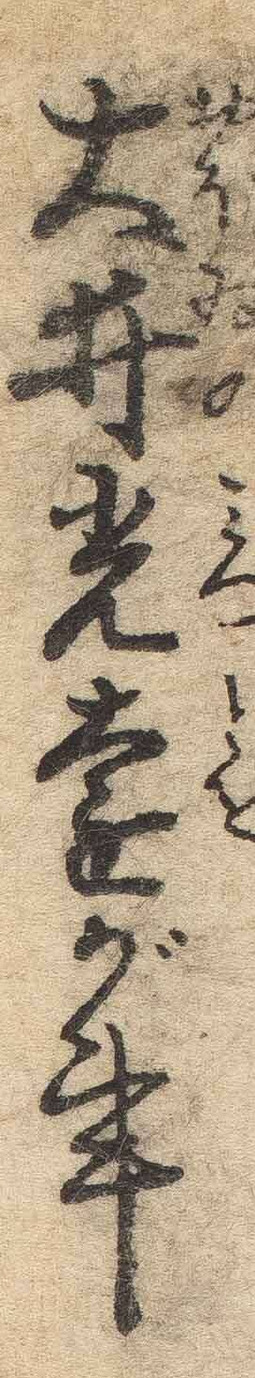一大井光遠が事
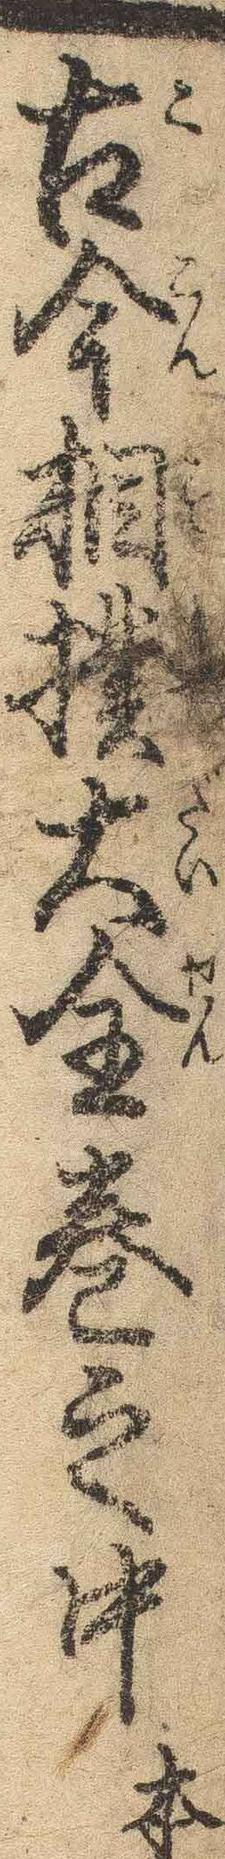一古今相撲大全巻之中本
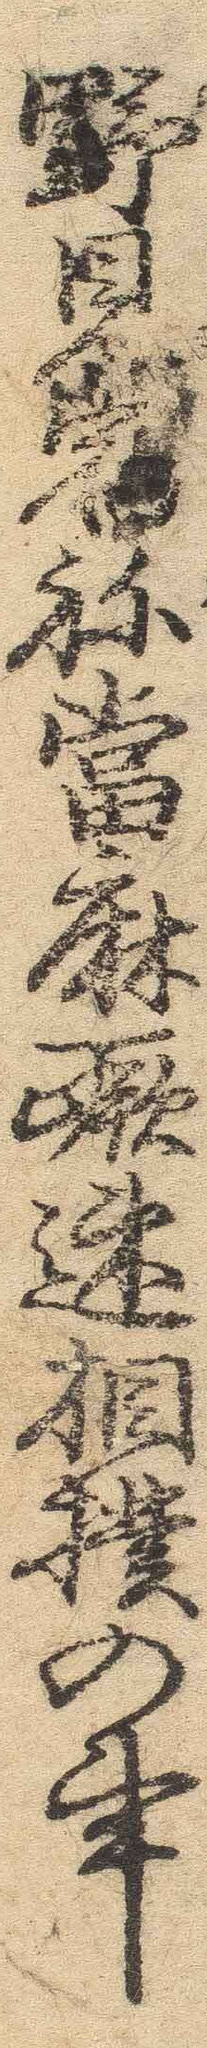一野見宿祢当麻蹶速相撲の事
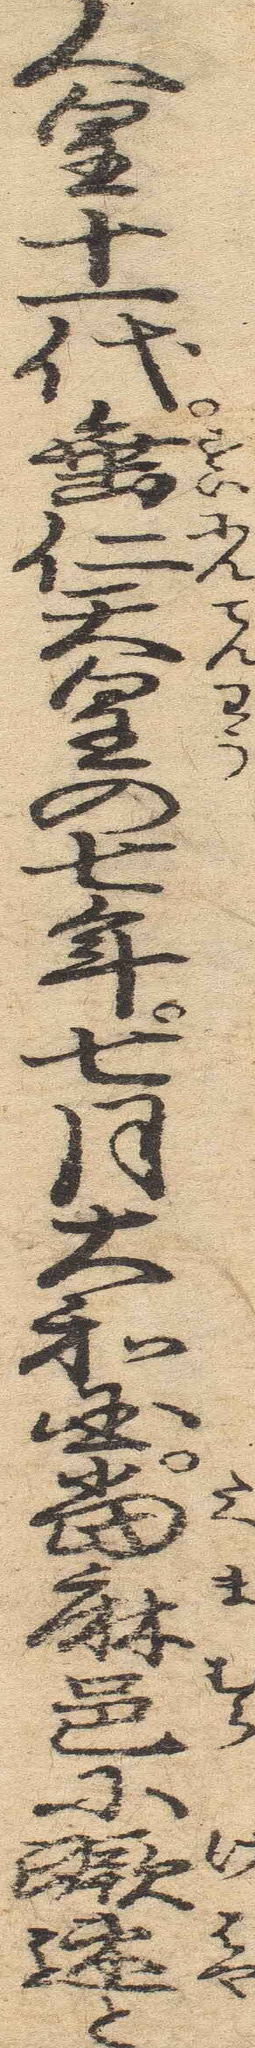人皇十一代垂仁天皇の七年。七月大和国。当麻邑に蹶速と
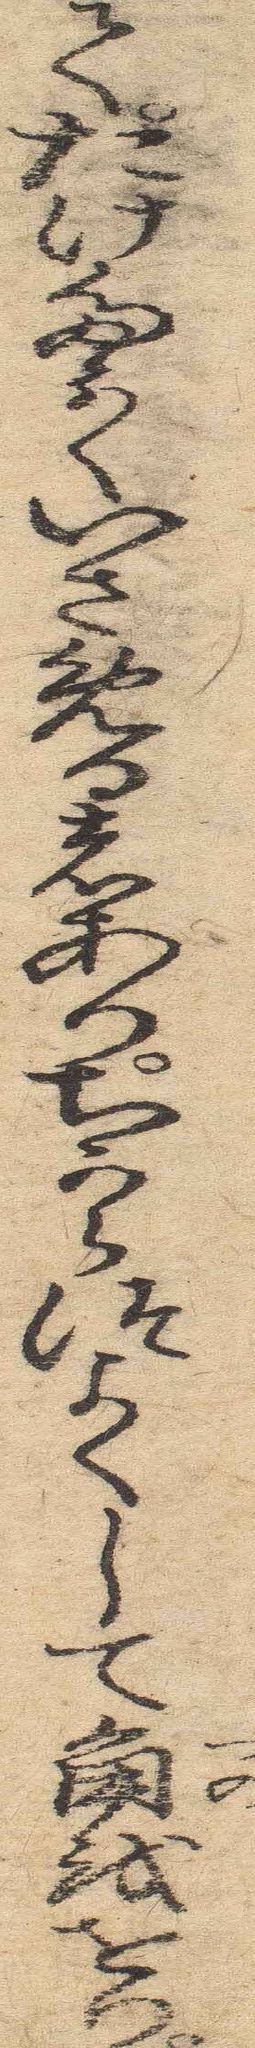て。たけたかくいさめる者あり。ちからつよくして角をり。
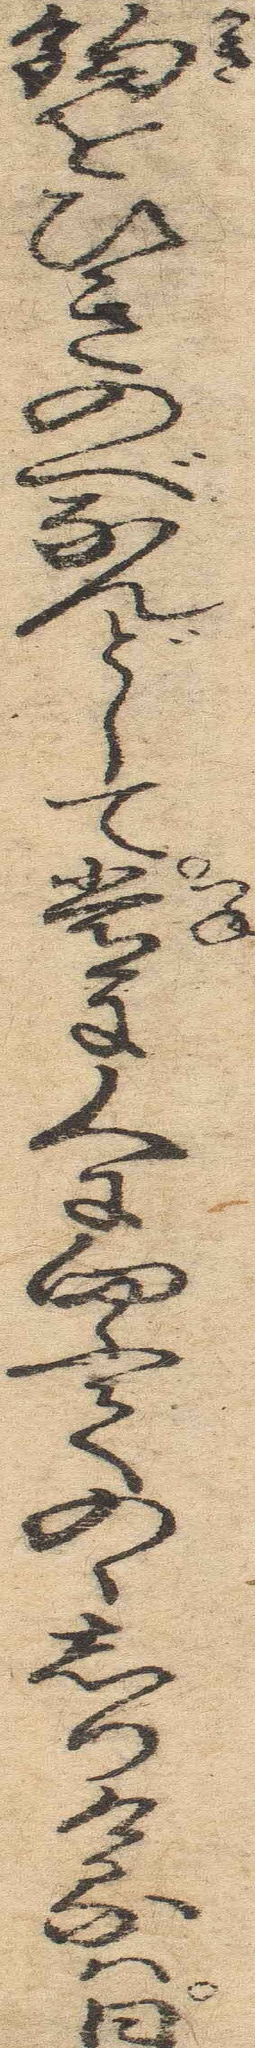鈎をひきのべなんどして。常に人に向ふてのゝしりけるは。日
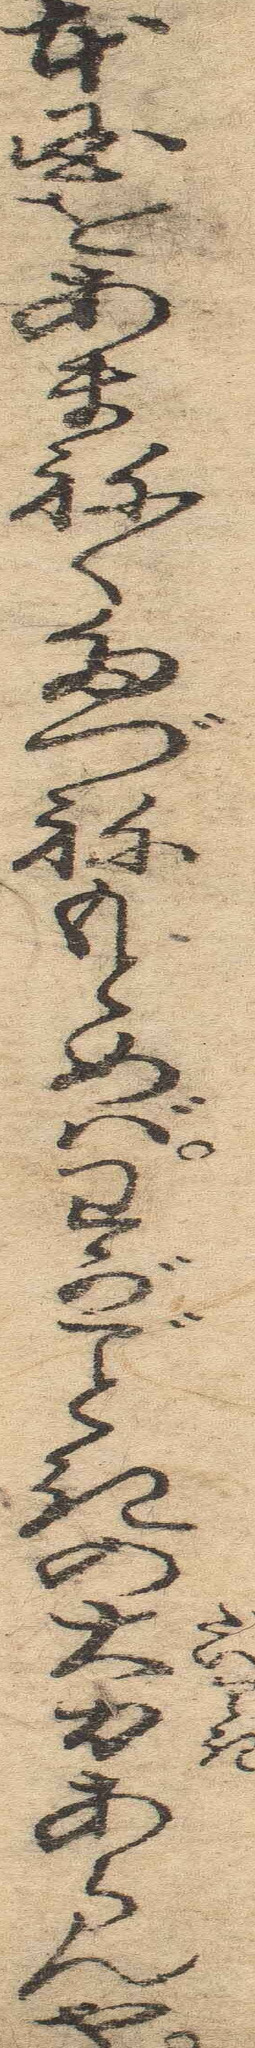本国をあまねくたづねもとめば。わがごときの大力あらんや。
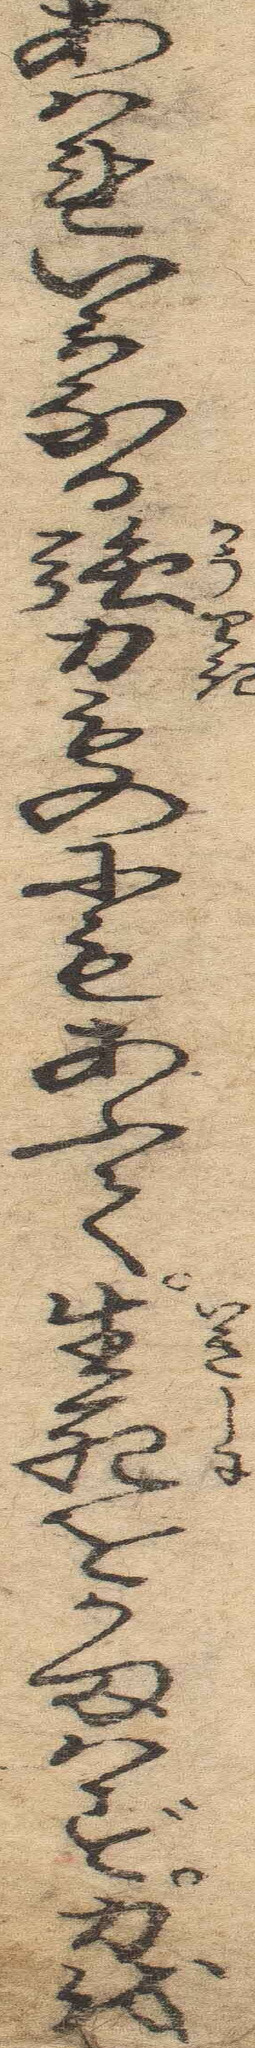あはれいかなる強力ものにもあふて。生死をかまはず。力を
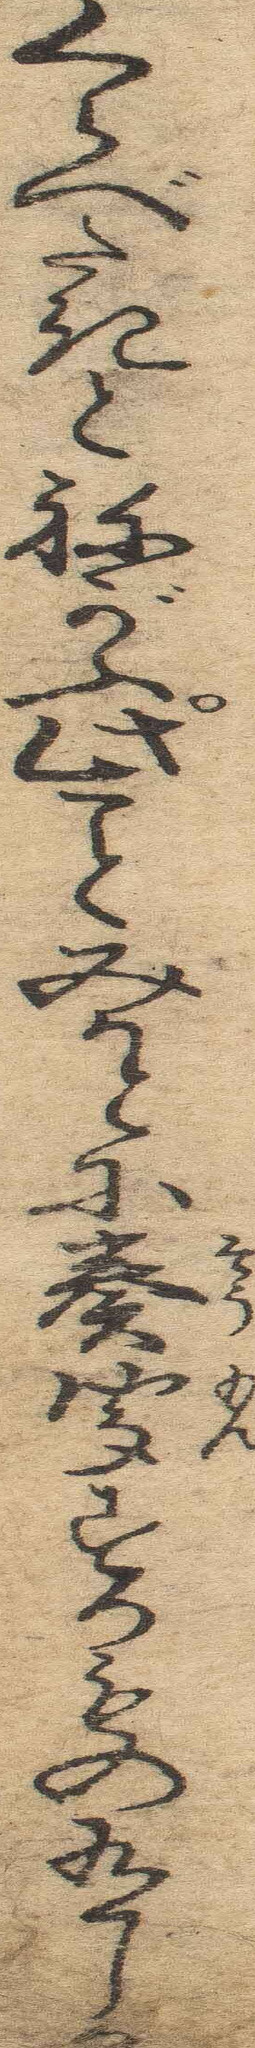くらべたきとねがふ。此ことみかとに奏聞するもの有しかば
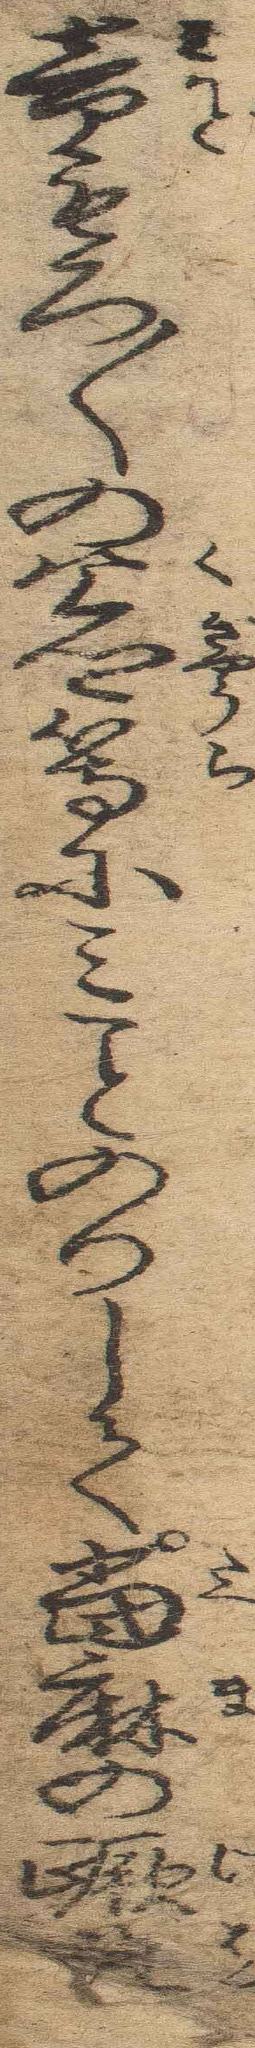帝もろ〳〵の公卿等にみことのりして当麻蹶速は天

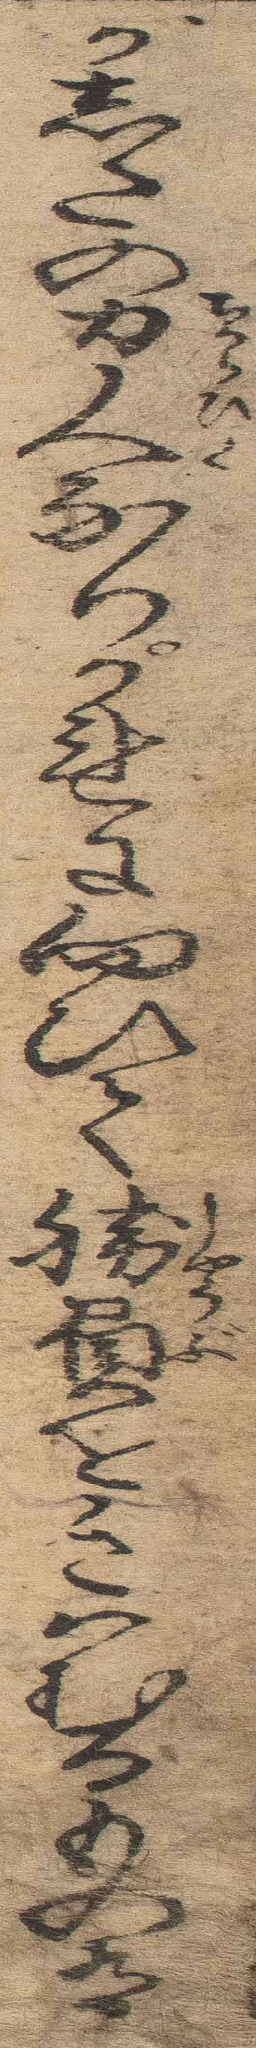がしたの力人なり。かれに向ひて勝負をきはむるもの有ん
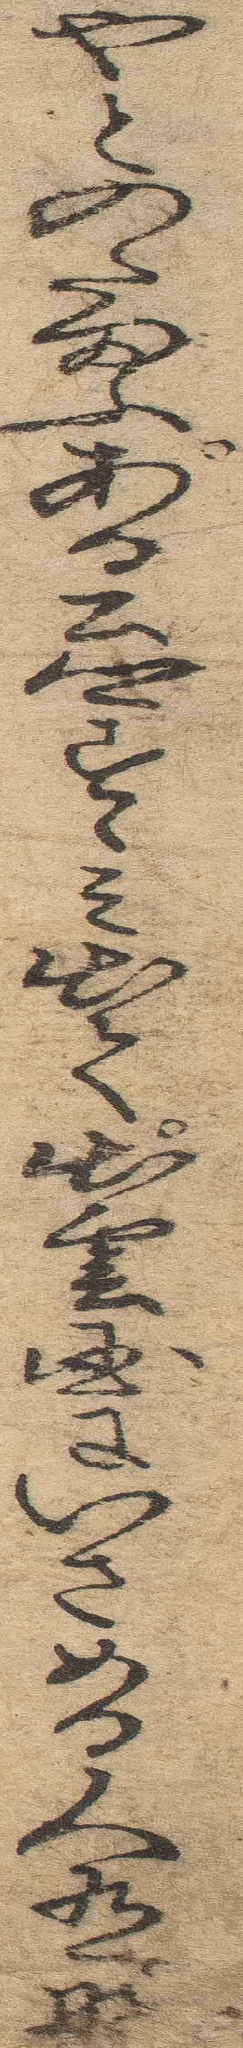やとのたまふ。ある公卿すゝみ出て出雲の国にいさめる人有。野
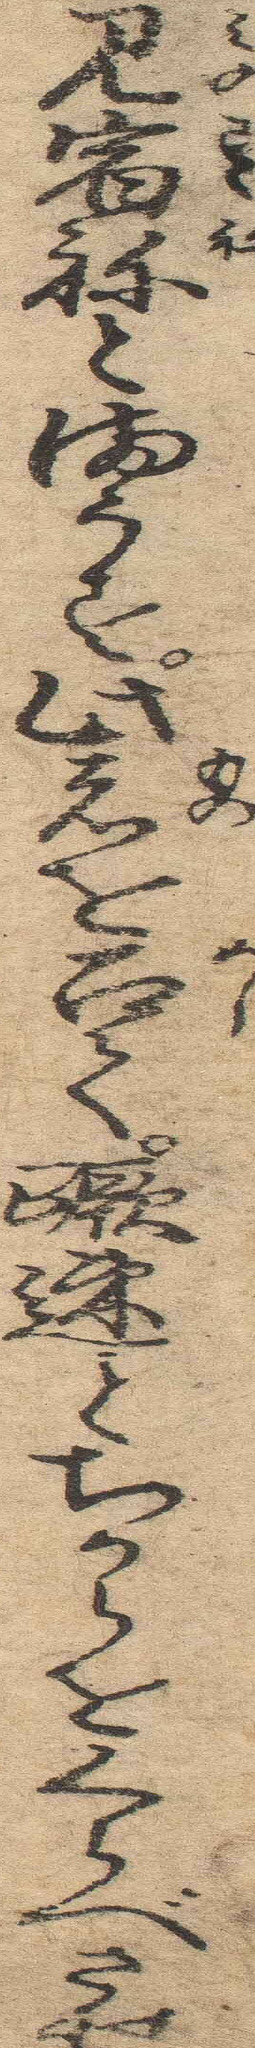見宿祢とまうす。此者を召て蹶速とちからをくらべさせ
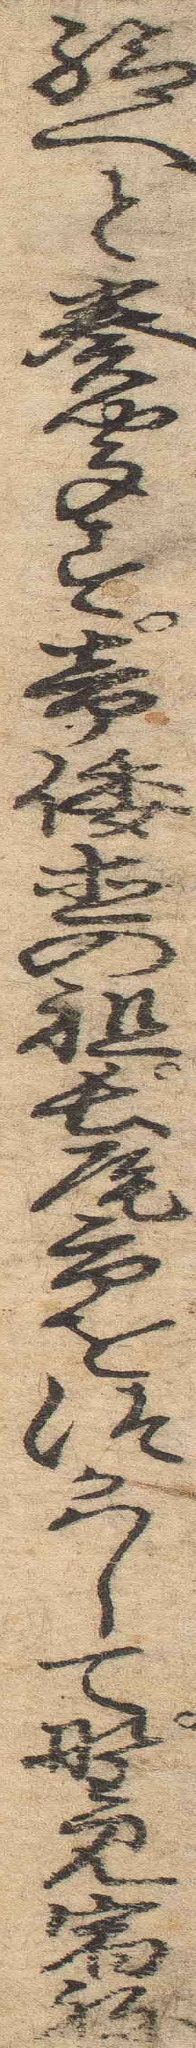給へと奏聞す。帝倭直の祖。長尾市をつかはして野見宿祢
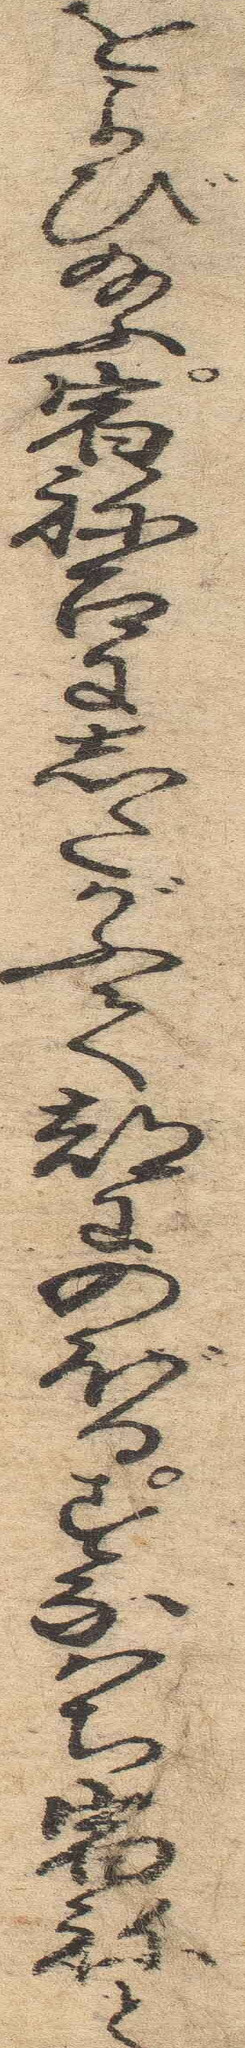をよび給ふ。宿祢召にしたがふて都にのぼる。すなはち宿祢と
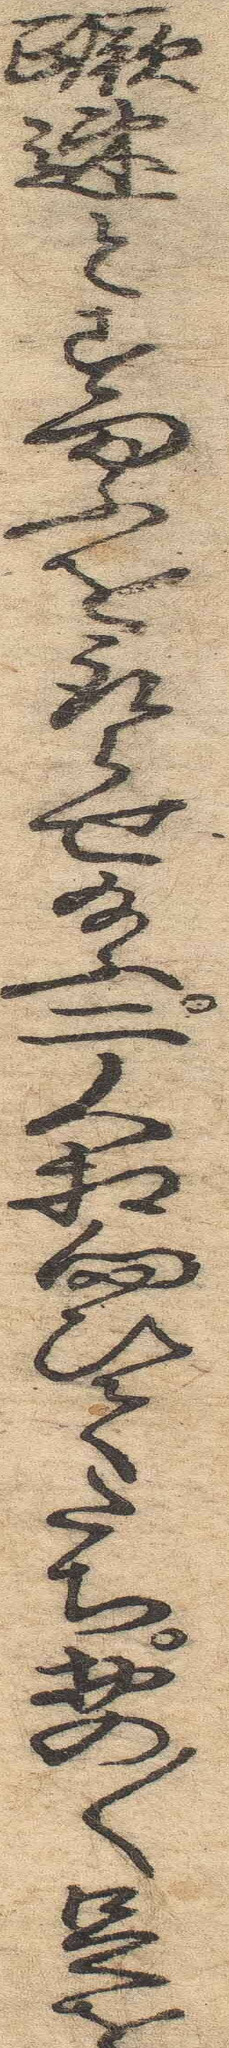蹶速とすまふを取らせ給ふ。二人相向ひてたち。おの〳〵足を
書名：古今相撲大全
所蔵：東京学芸大学附属図書館 国文学研究資料館
